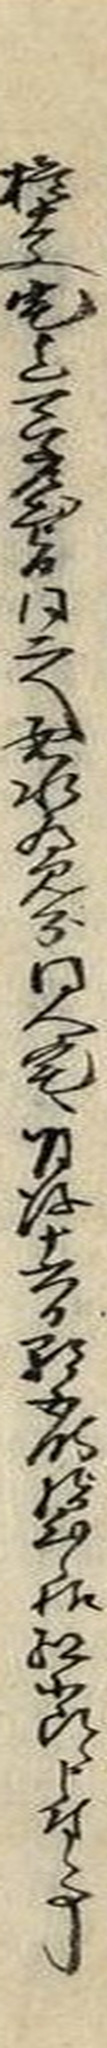権大夫宅迄可差出旨同二人悪水為見分同人宅へ明後十六日朝五時指出候様組小頭へ申付事
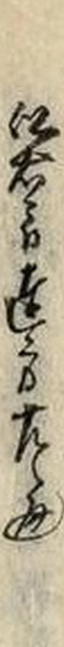但右に付達方左之通
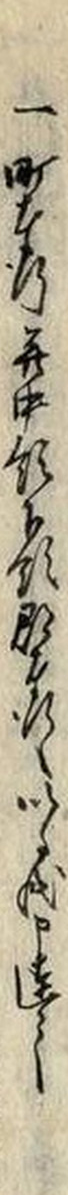一町奉行并中領下領郡奉行へ以手紙申達之
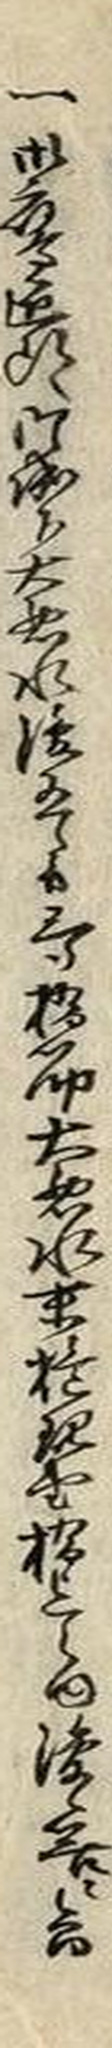一御鷹匠頭へ御城下大悪水浚有之に付三ツ橋筋大悪水末権現堂橋迄之内浚候筈に候間
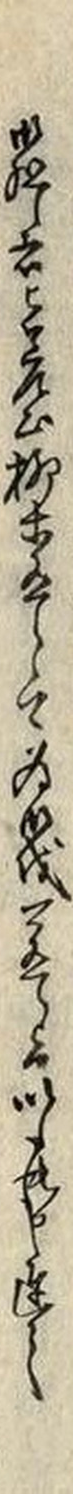御組之者被差出柳等有之候はゝ為御伐可有之旨以手紙申達之
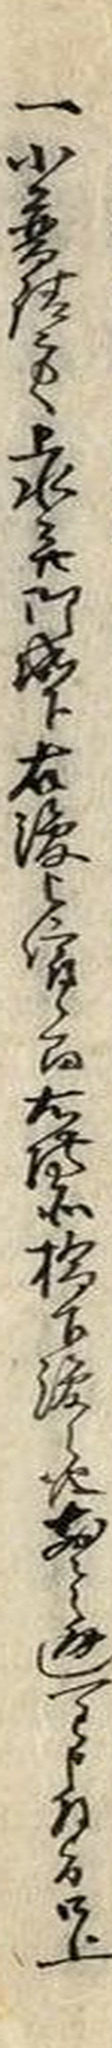一小普請方へ上水并御城下右浚被仰付候間右場所橋下浚之儀前々之通可被申付旨口上
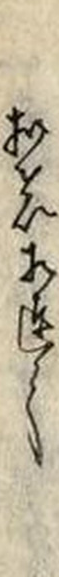控を以相達之
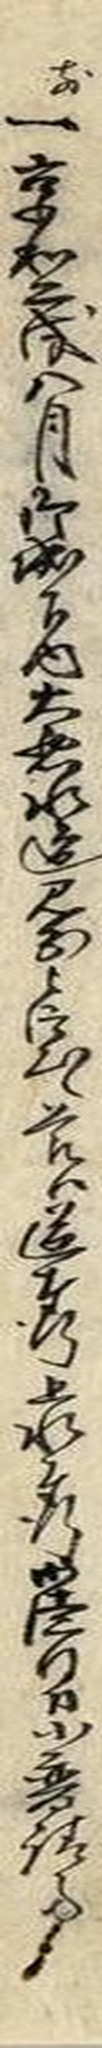前一享和二戌八月御城下内大悪水道見分被仰出候節は道奉行上水奉行御徒目付小普請方
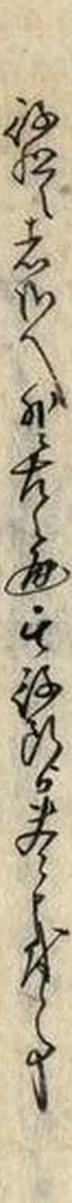役組之者弐人外に左之通其役頭ゟ夫々申付候事
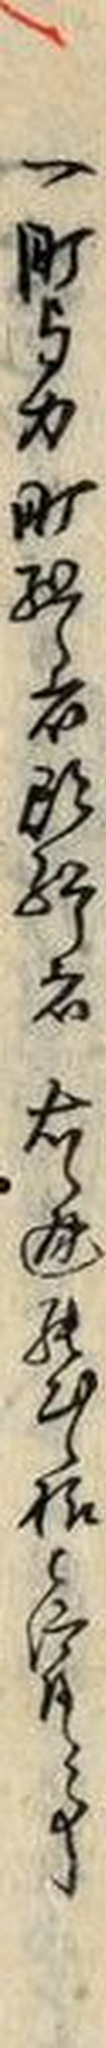一町与力町組之者郡組之者右之通罷出候様被仰付候事

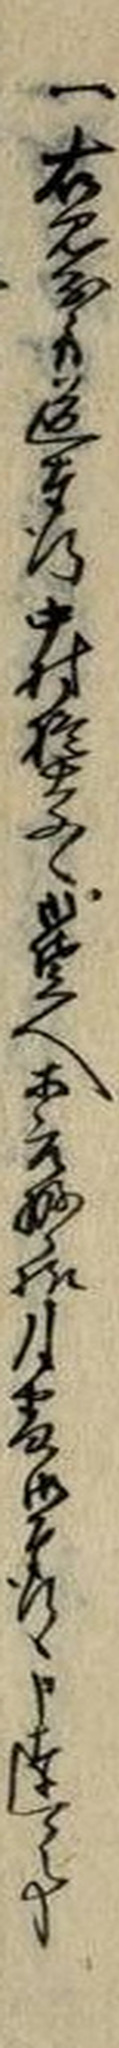一右見分に付道奉行中村権大夫へ御貸人等取扱候様月番御奉行へ申達候事
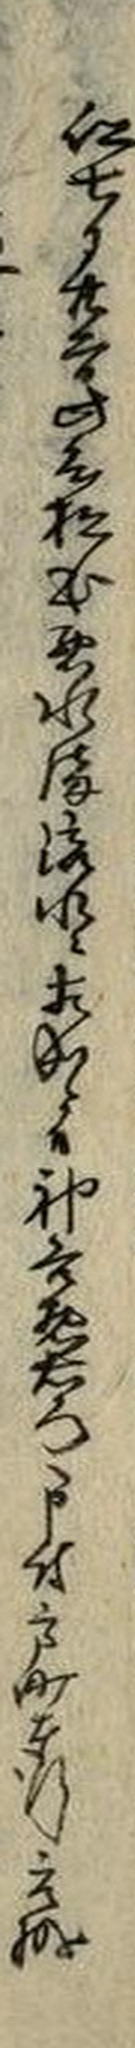但七月廿二日此度松本悪水溝流水に相成に付神谷惣右衛門へ申付方町奉行取扱
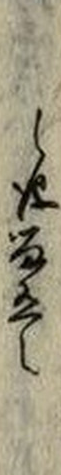之儀留有之
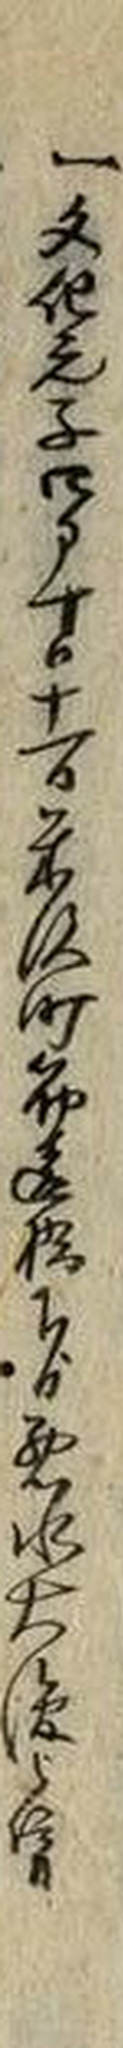一文化元子四月十日十一日米沢町筋違橋下ゟ悪水大浚被仰付
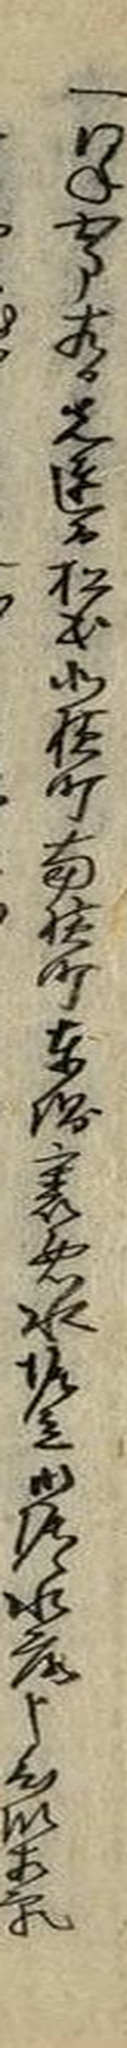一同年五月十九日先達て松本北横町南横町東側裏悪水堀立御堀へ水落申度段相願
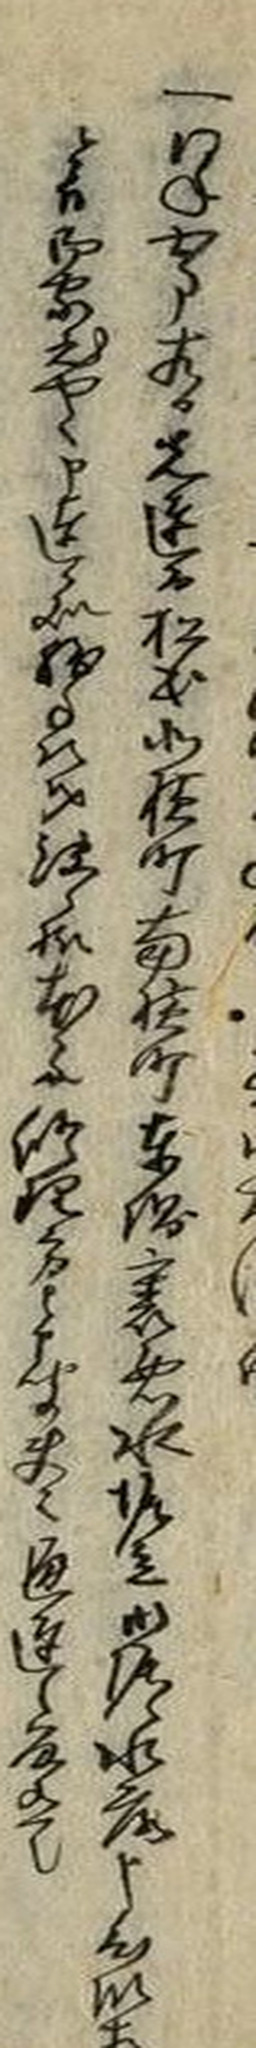候に付御家老中へ申達候処勝手次第決候様本多修理方被申聞候夫々通達之留有之
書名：御城下諸事之部
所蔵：福井県文書館 Fukui Prefectural Archives
